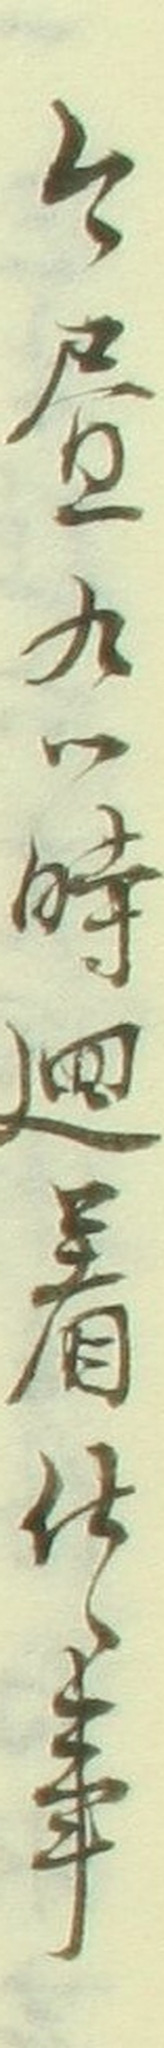今昼九ッ時廻着仕候事
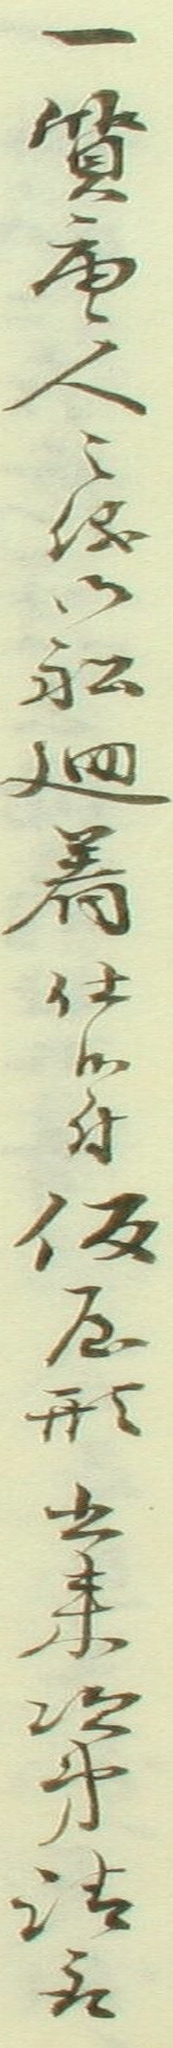一質唐人之儀御船廻着仕候付仮屋形出来次第請取
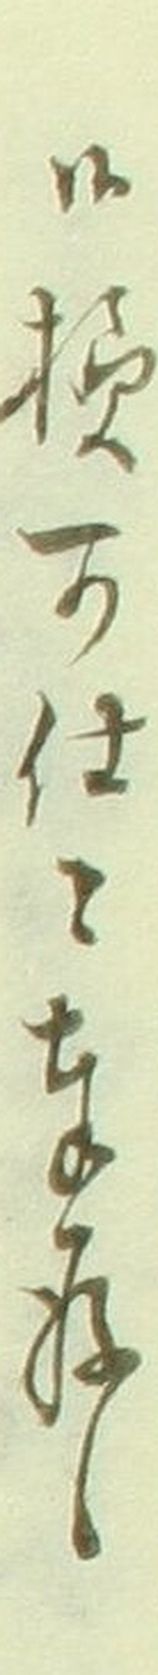候様可仕と奉存候
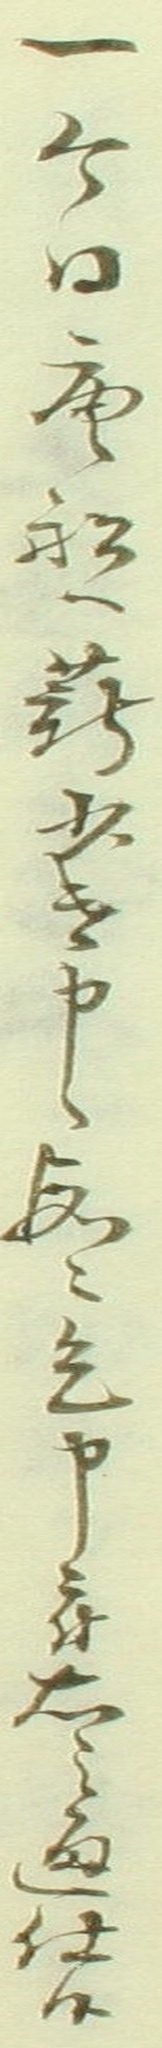一今日唐船へ薪少遣申候段々乞申に付右之通仕候
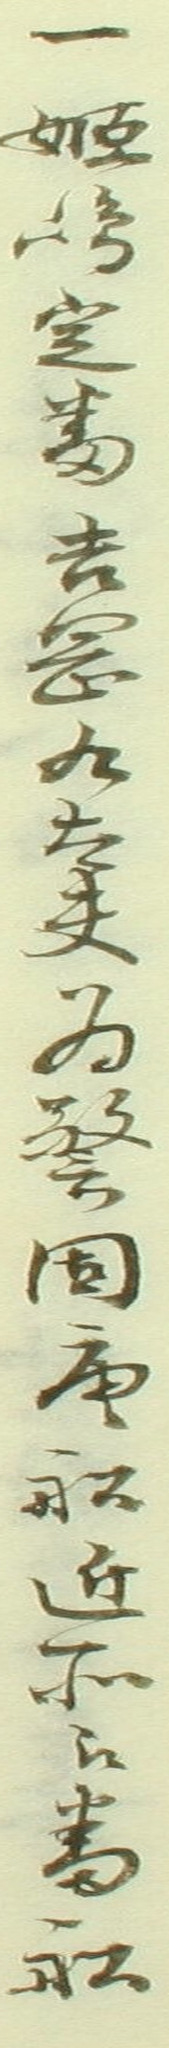一姫島定番吉岡九太夫為警固唐船近所え番船
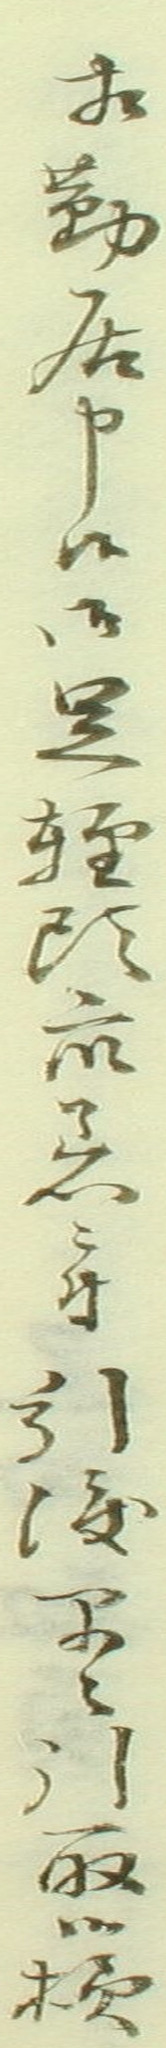相勤居申候御足軽頭衆着に付引渡早々引取候様
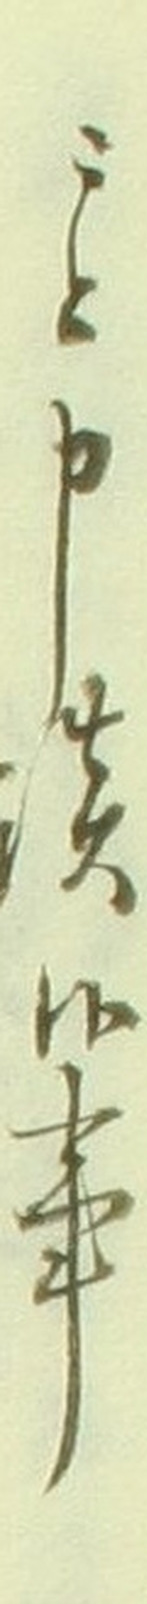にと申談候事
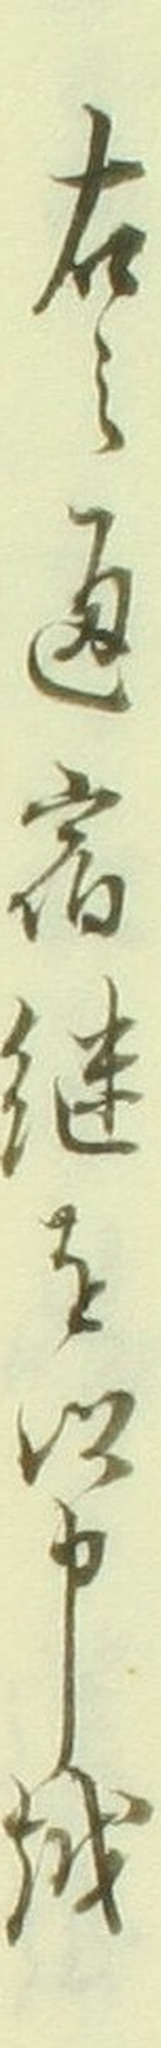右之通宿継を以申越
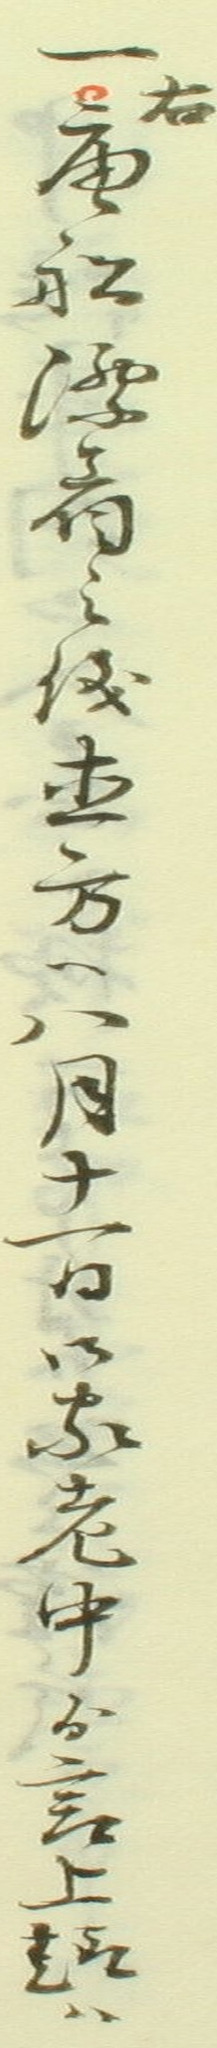一◦唐船漂着之儀直方へ八月十一日御家老中ゟ言上趣は
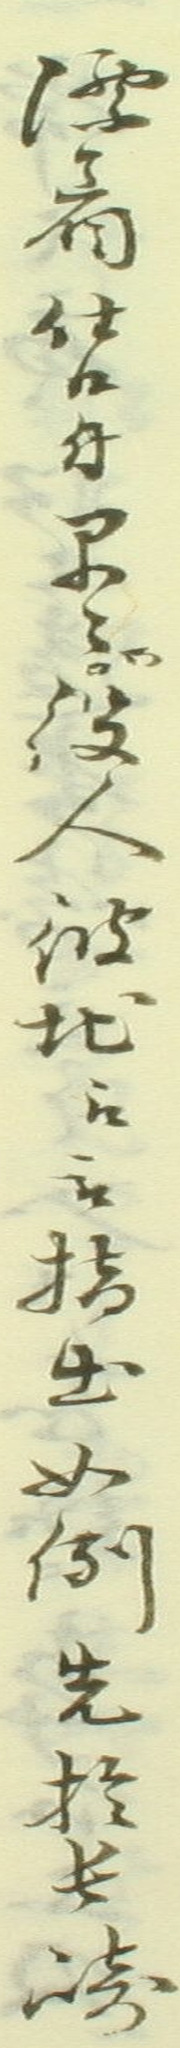漂着仕候付早々役人彼地え被指出如例先於長崎
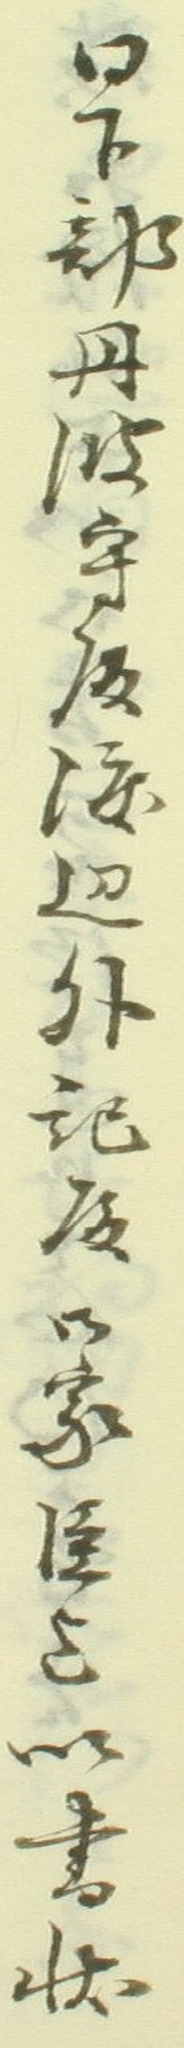日下部丹波守殿渡辺外記殿御家臣迄御書状
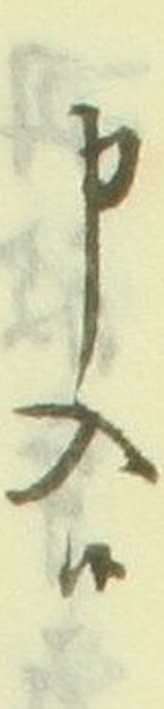申入候
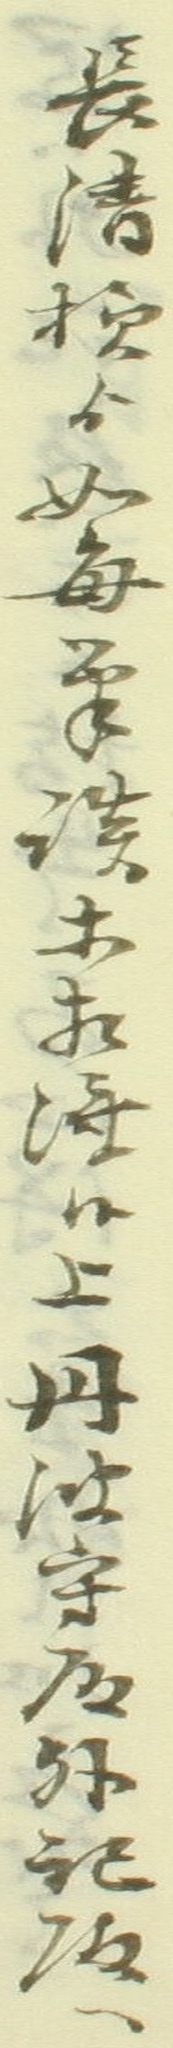長清様ゟ如毎筆談等相済候上丹波守殿外記殿へ
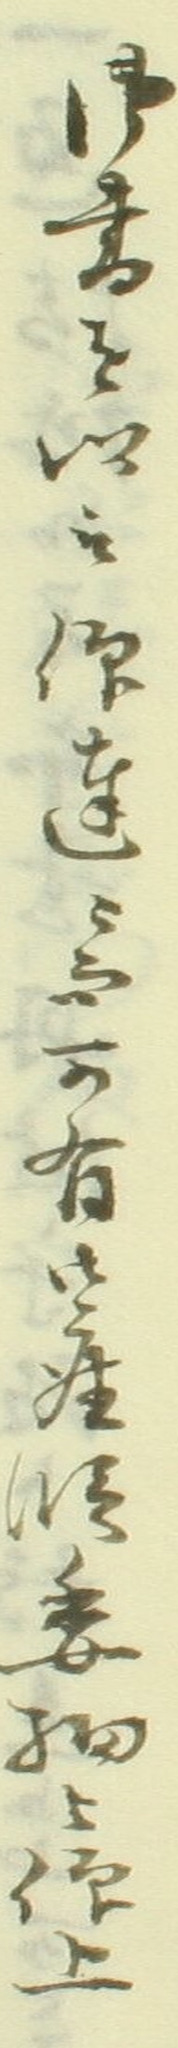御書を以被仰達に而可有御座段委細被仰上
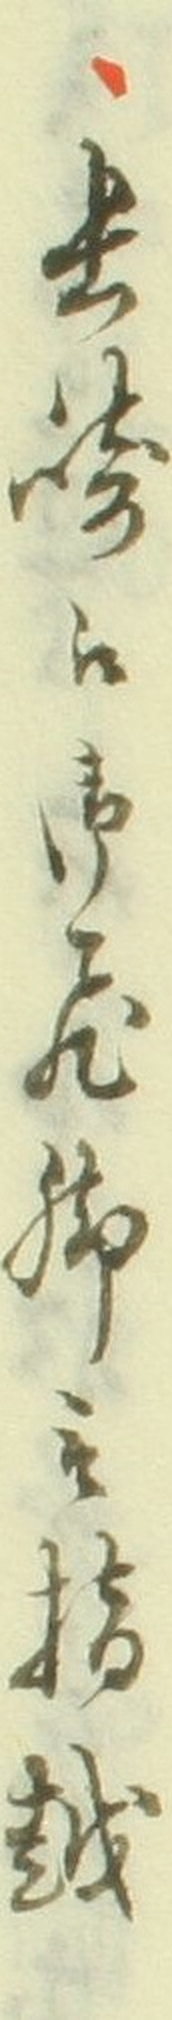長崎え御飛脚被指越
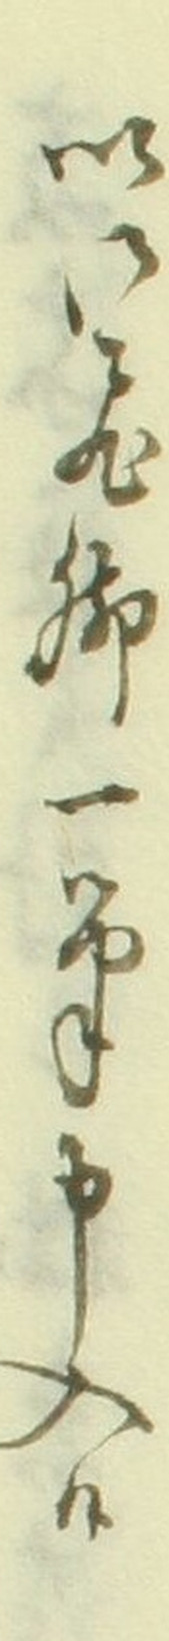以御飛脚一筆申入候
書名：異国船漂着記
